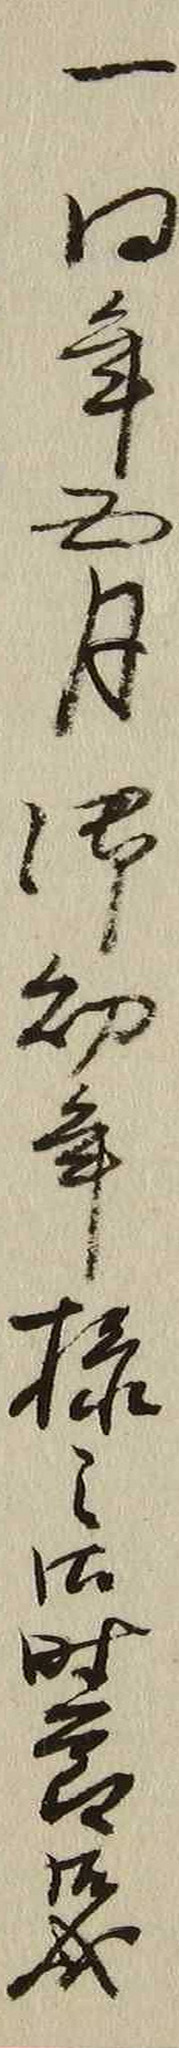一同年五月御幼年様之御時節御成
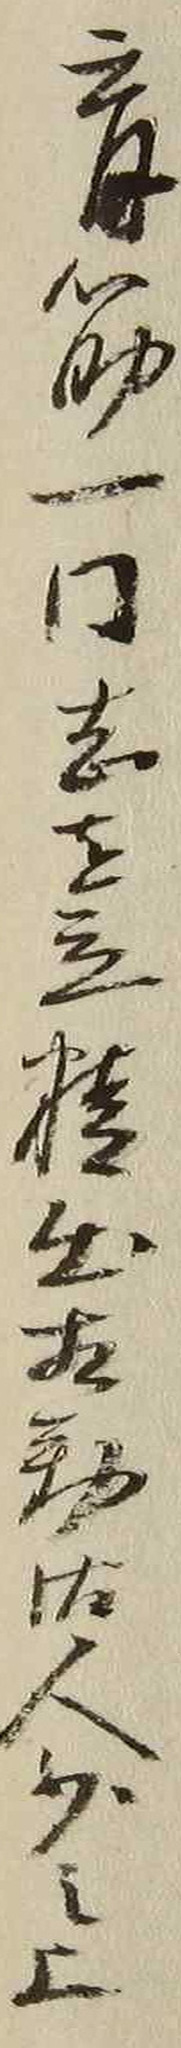育筋一同志を立精出相勤御人少之上
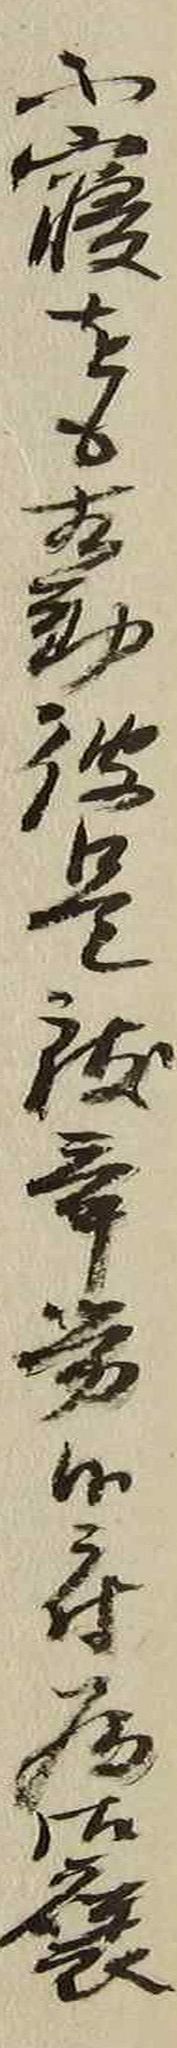不寝をも相勤彼是致辛労候ニ付為御褒
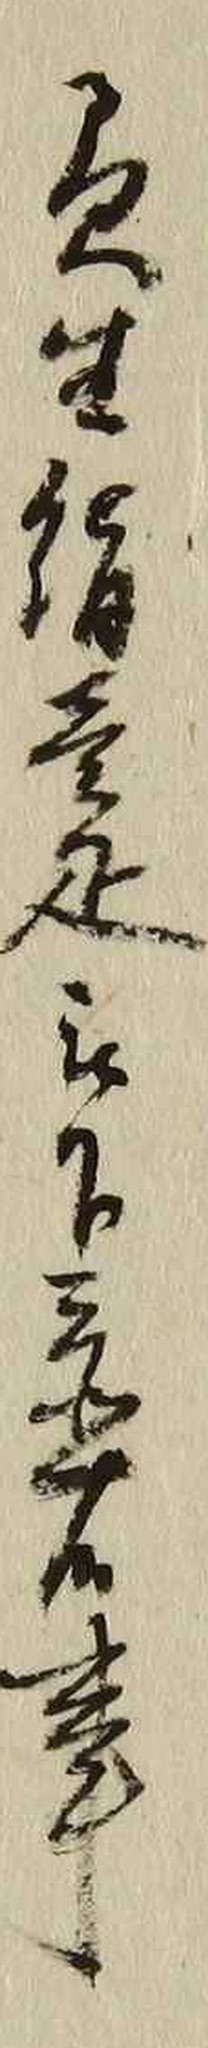美生絹壱疋被下置候事
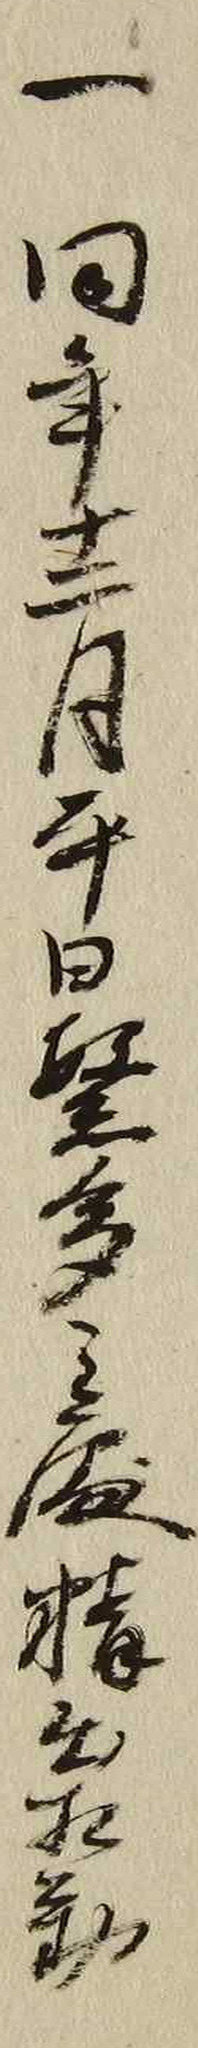一同年十二月平日繁多之処精出相勤
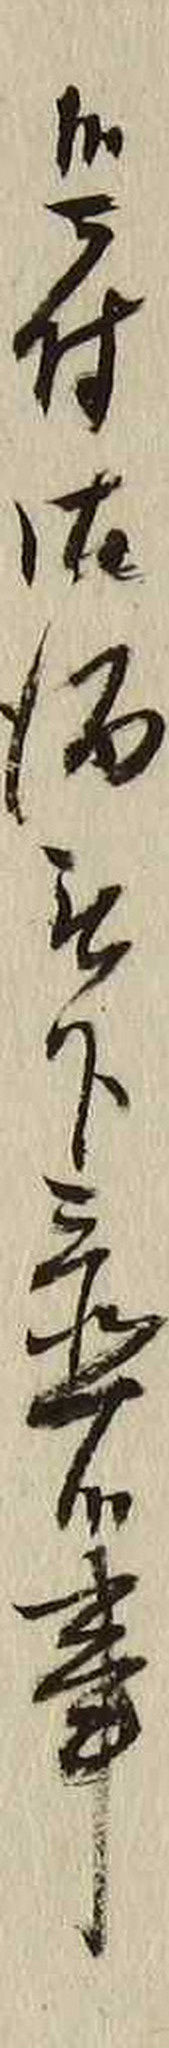候ニ付御酒被下置候事
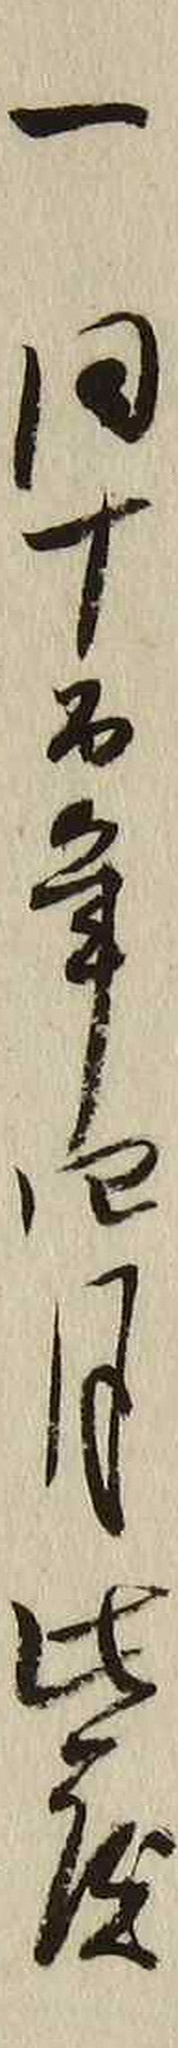一同十酉年四月此度
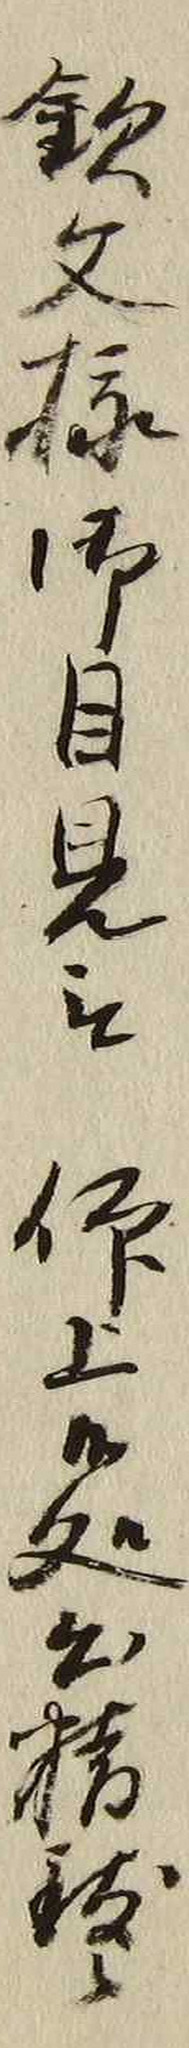欽文様御目見被仰上候処出精致候
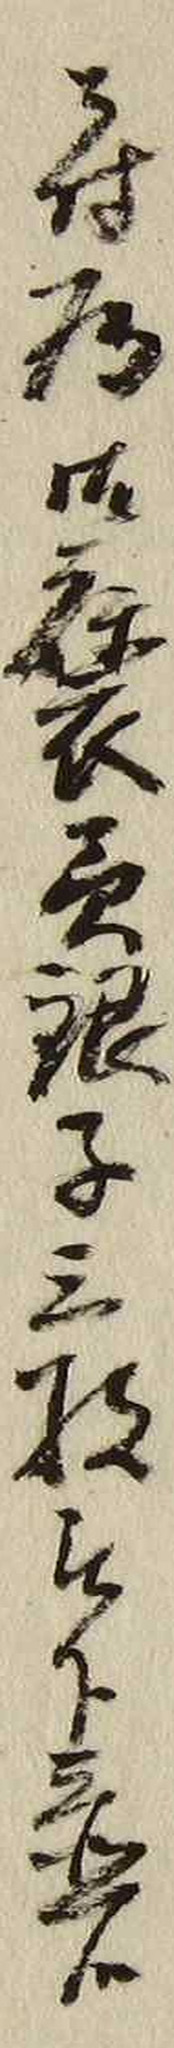ニ付為御褒美銀子三枚被下置候
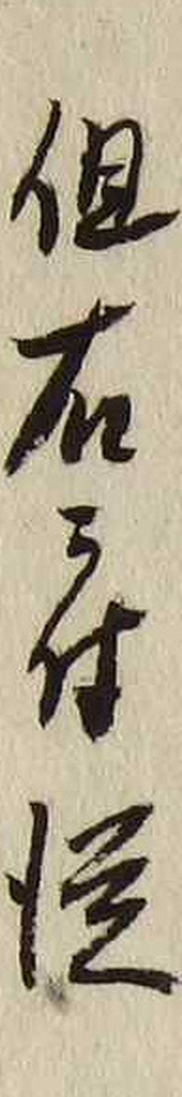但右ニ付従
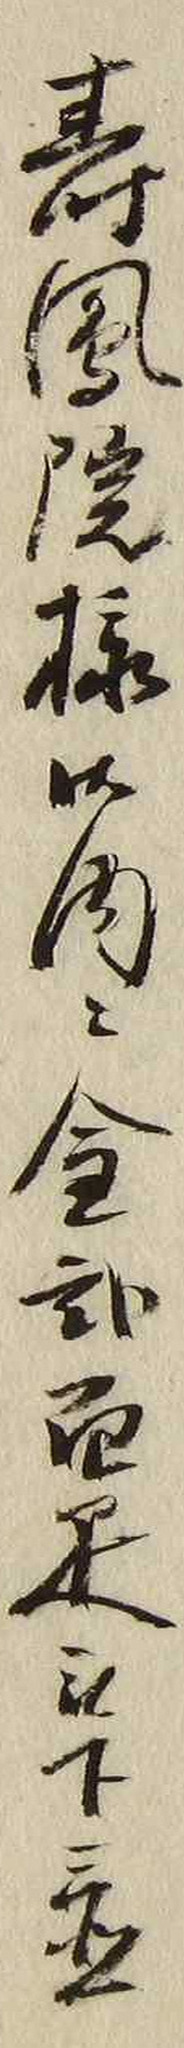寿鳳院様御内々金弐百疋被下置

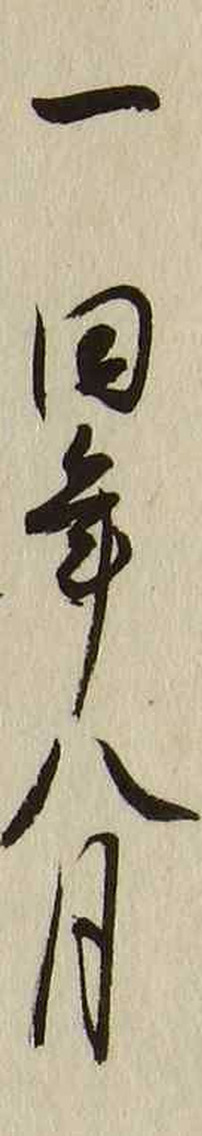一同年八月
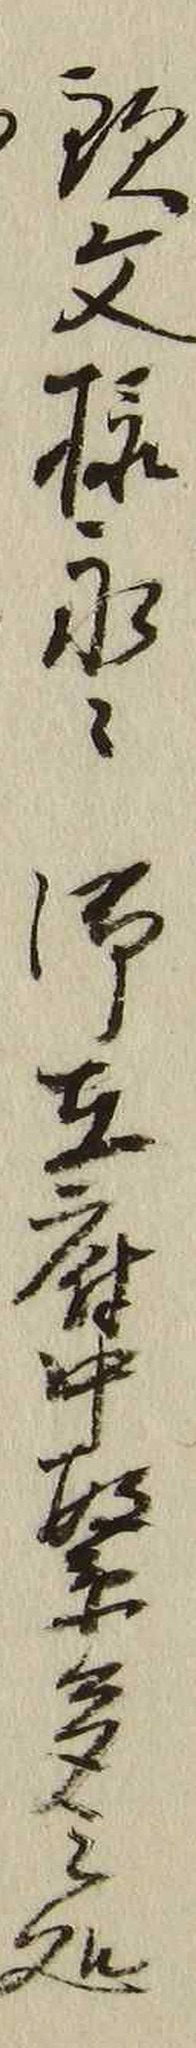欽文様永ニ御在府中繁多之処
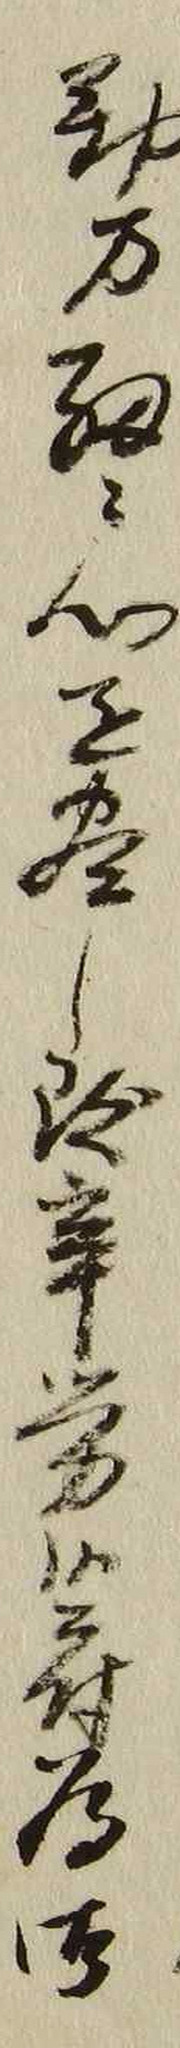勤方細ニ心を尽し致辛労候ニ付為御
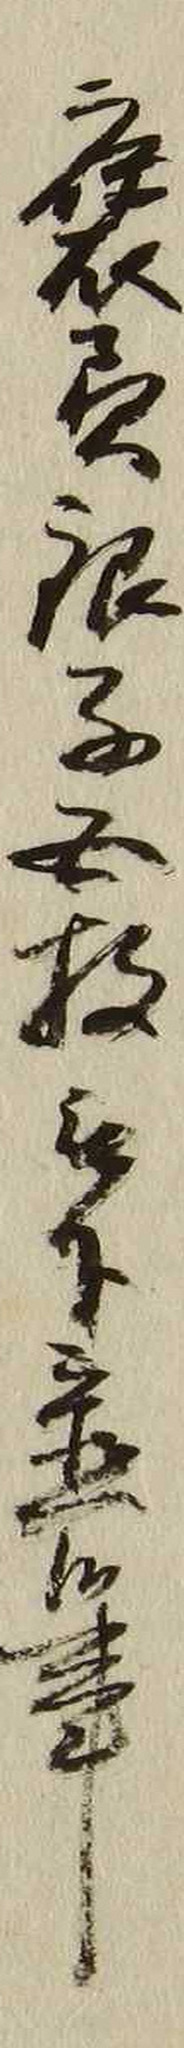褒美銀子五枚被下置候事
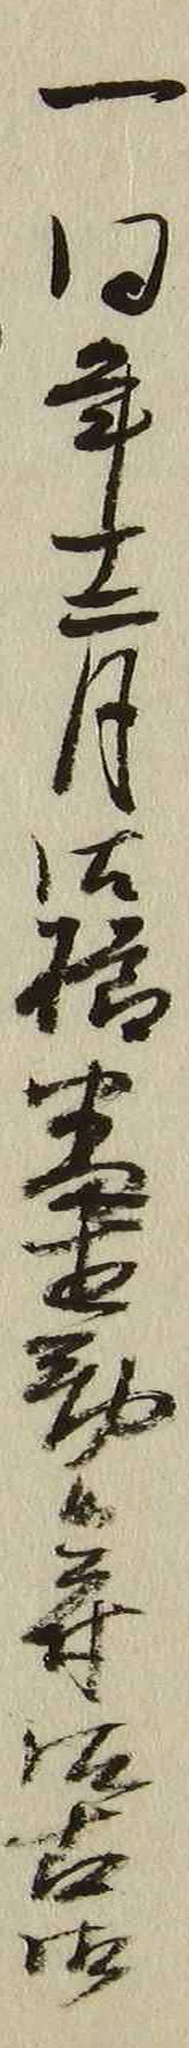一同年十二月御膳番相勤候ニ付御古御
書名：諸士系譜　巻之345　も之部1
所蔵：会津若松市立会津図書館
